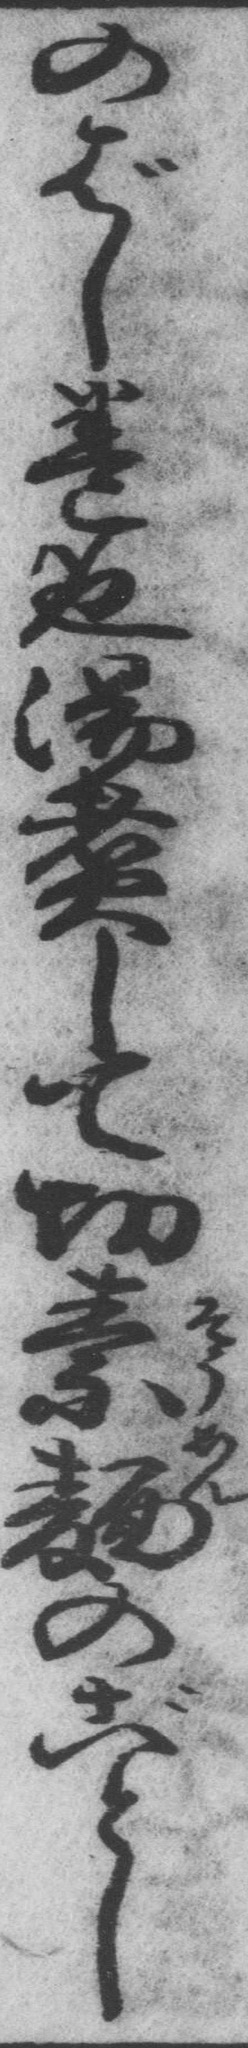のばし巻也湯煮して切素麺のごとし
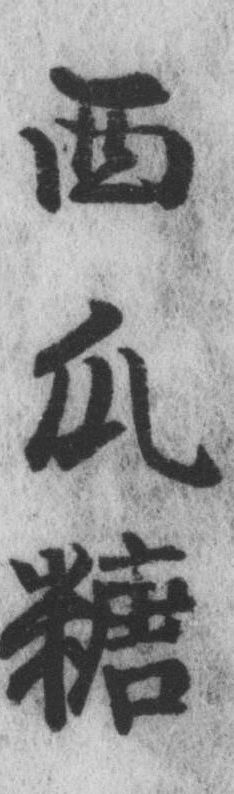西瓜糖
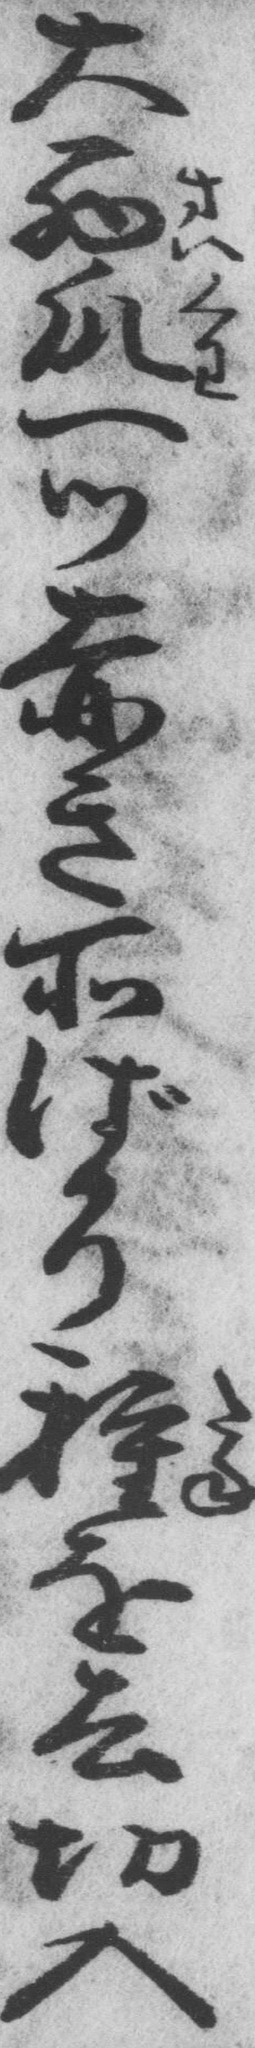大西瓜一ツ赤き所ばかり種を去切入
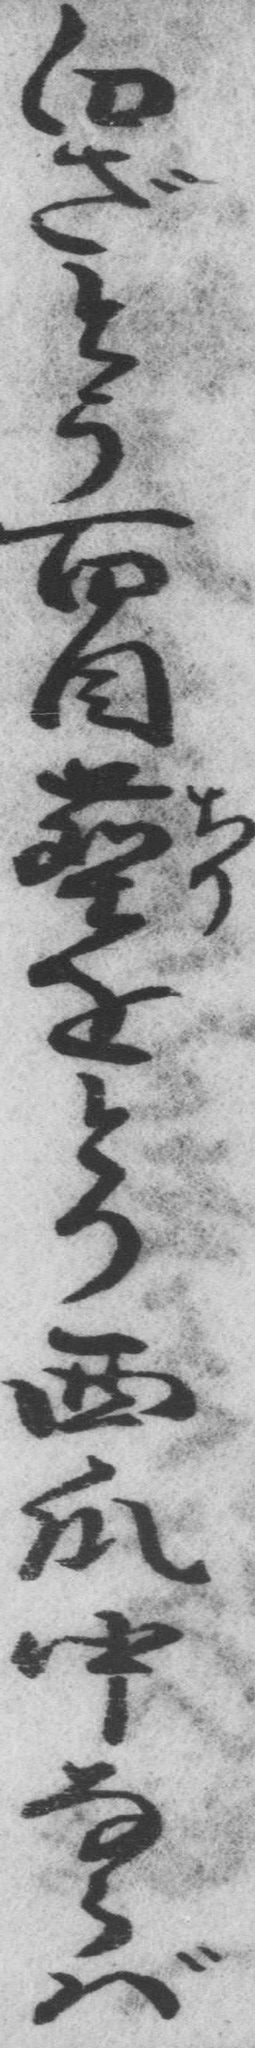白さとう百目塵をとり西瓜中ならば
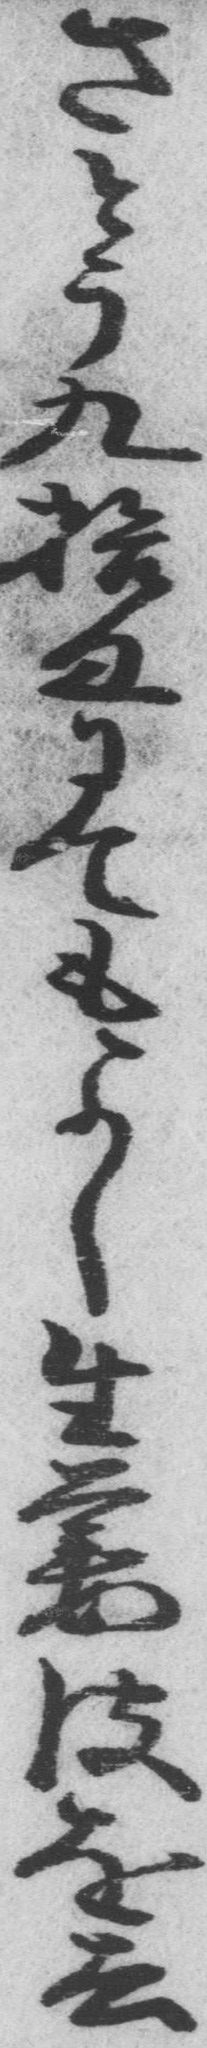さとう九拾匁にてもよし生姜皮を去
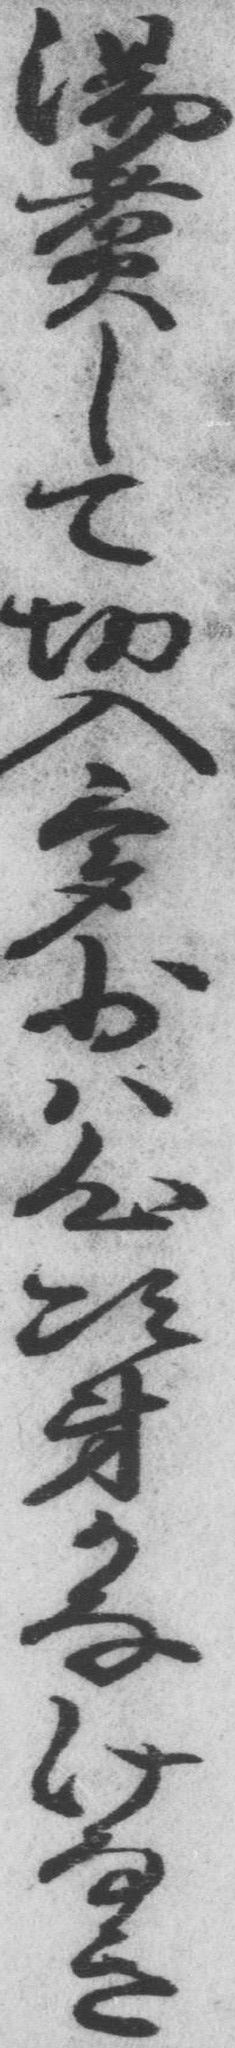湯煮して切入多少は心次第かなけなき
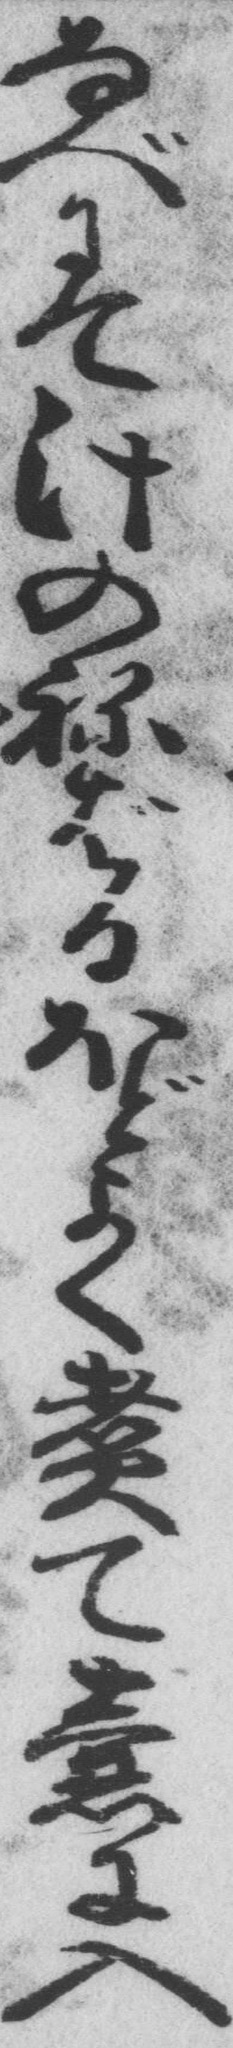なべにて汁のねばるほどよく煮て壺に入
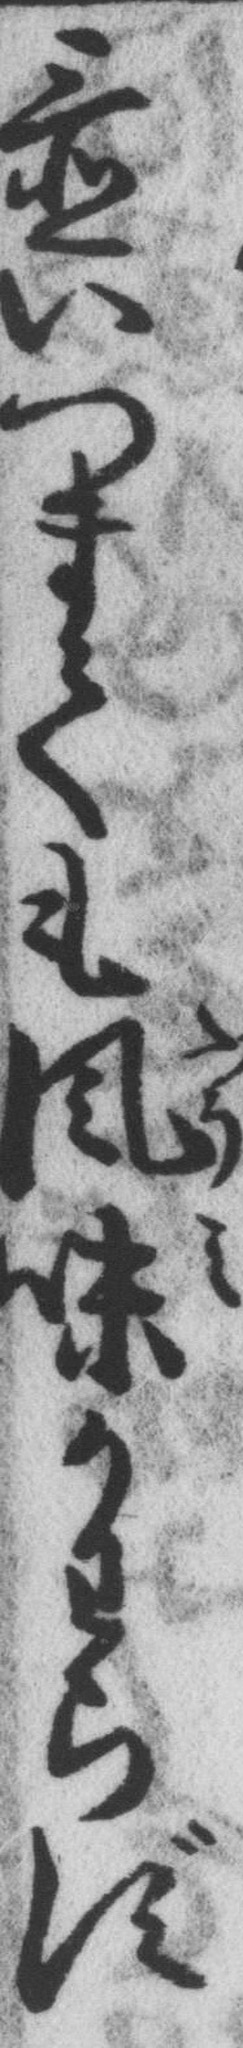置いつまても風味かわらず
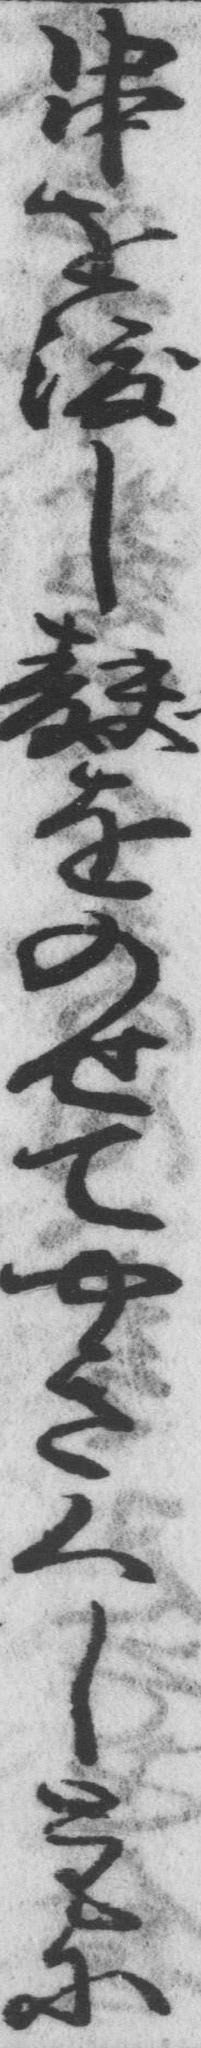串を渡し麩をのせてやきくしともに
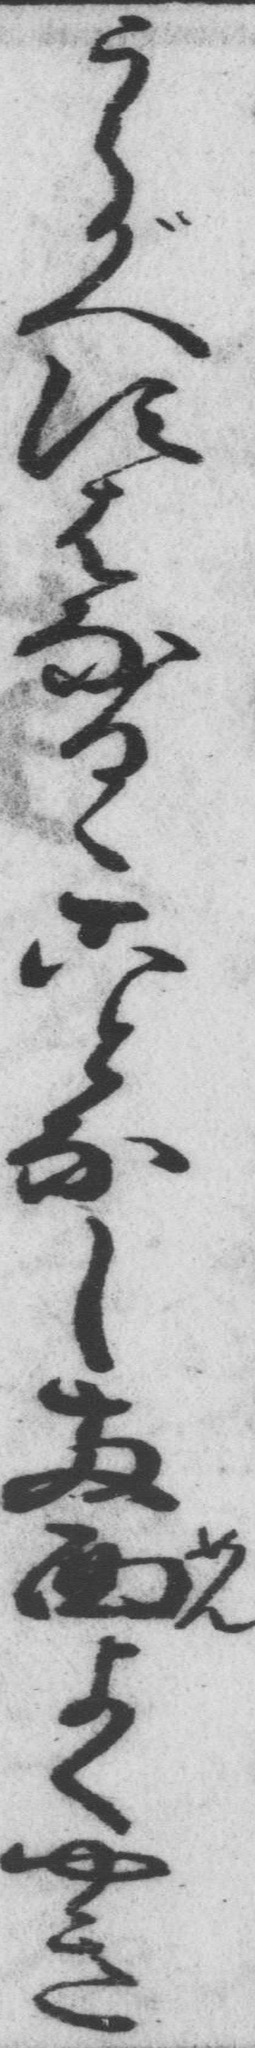うらがへすはなるゝことなし両面よくやき
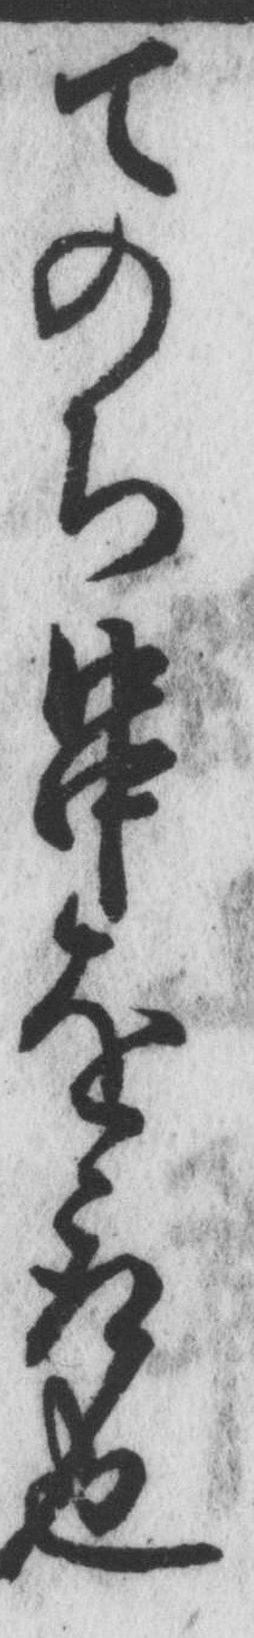てのち串を取也
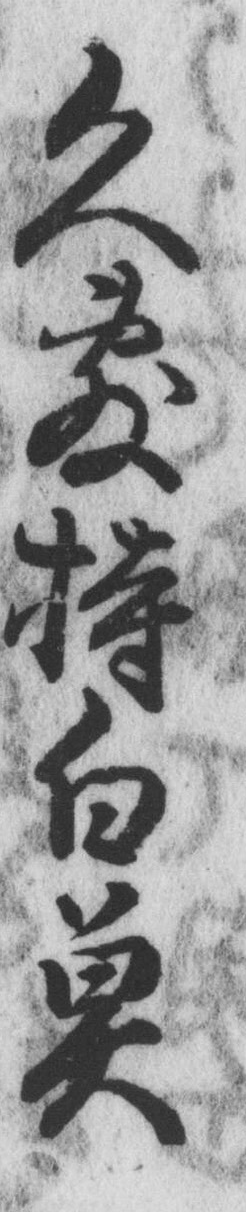久敷持白魚
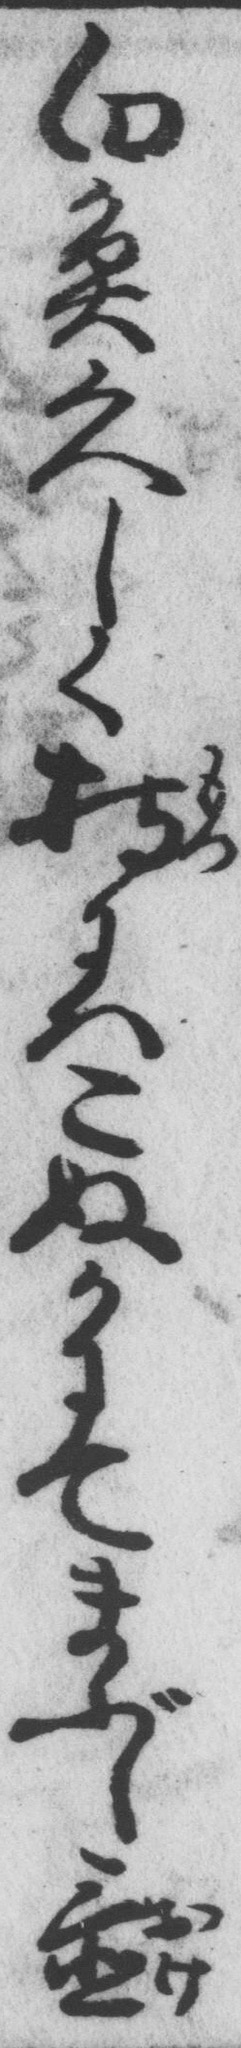白魚久しく持にはこぬかにてまぶし置
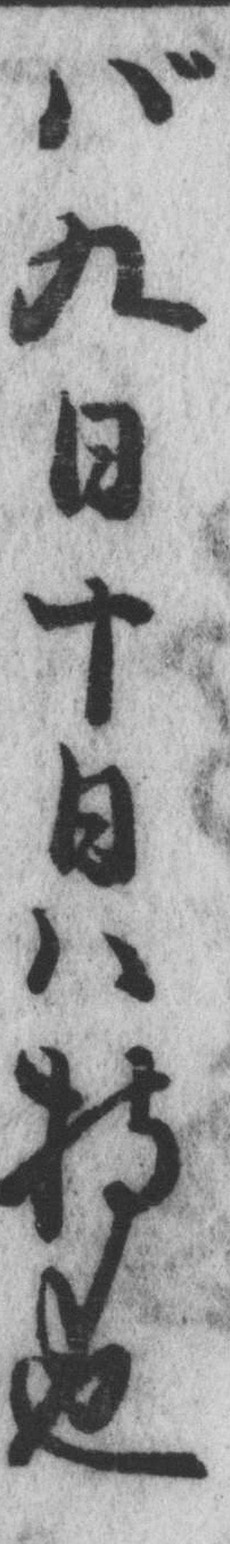ば九日十日は持也

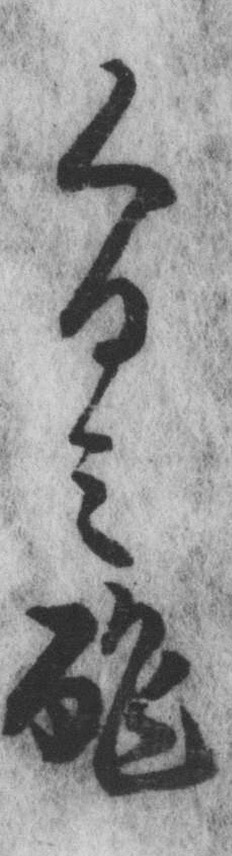くるみ酢
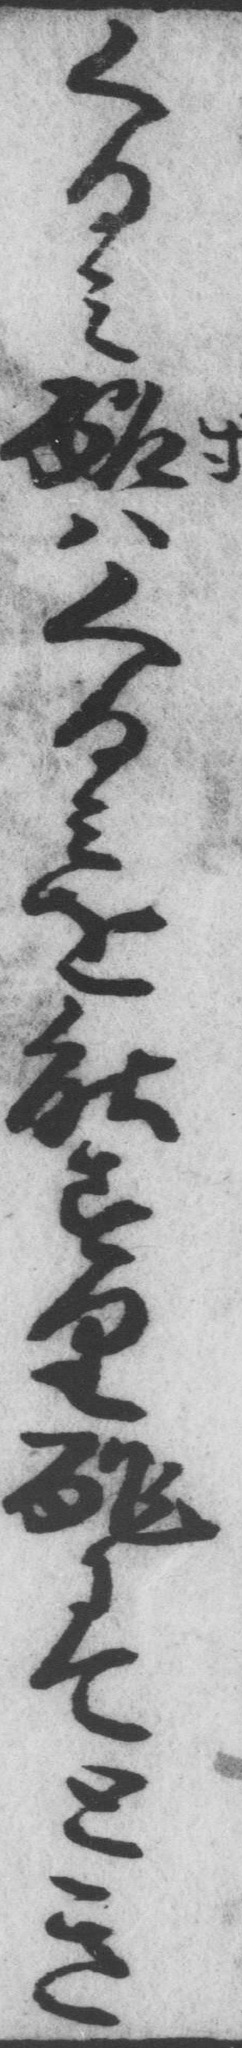くるみ酢はくるみを能すり酢にてとき
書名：料理山海郷
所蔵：大阪府立大学学術情報センター 国文学研究資料館
